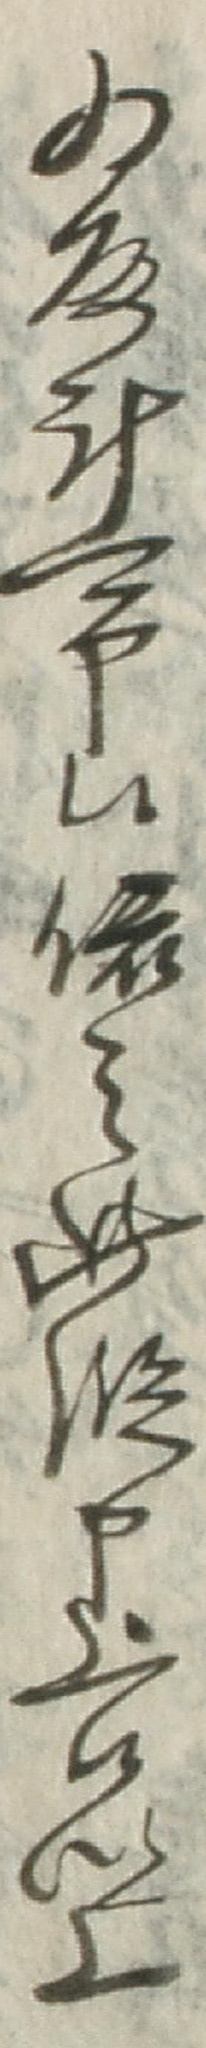為取計可申候依之此段申上候以上
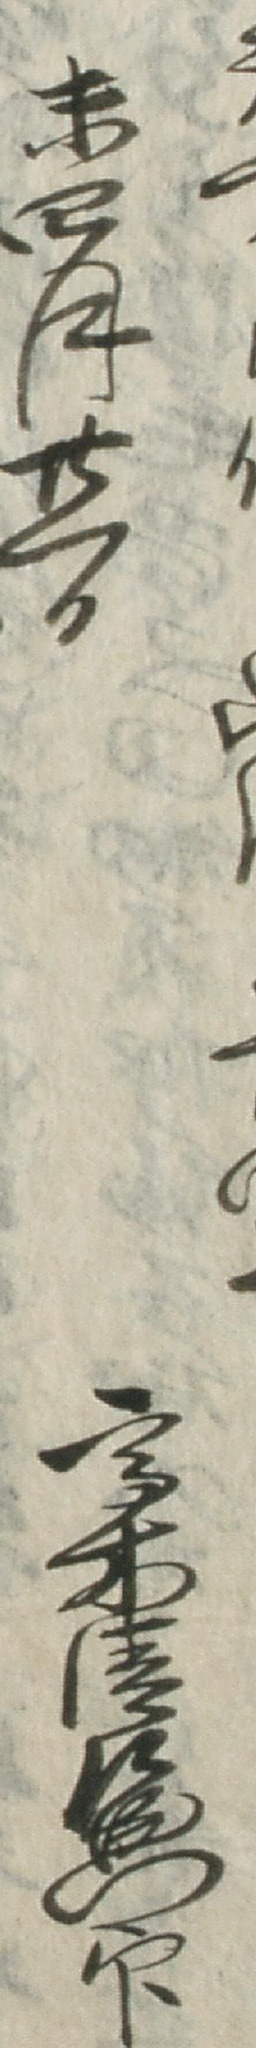未四月廿一日高木清左衛門印
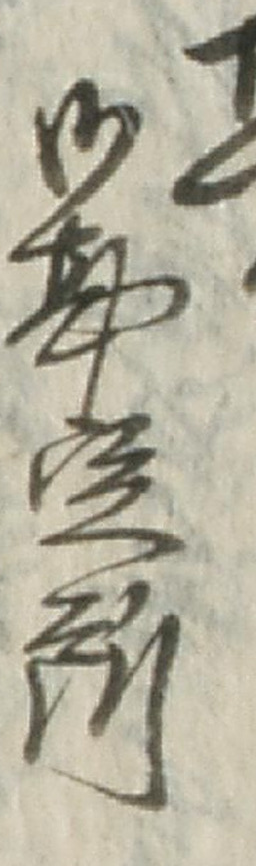御勘定所
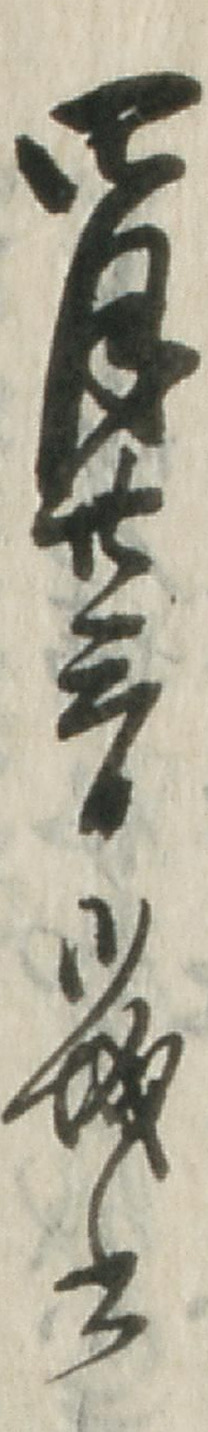四月廿三日御城書
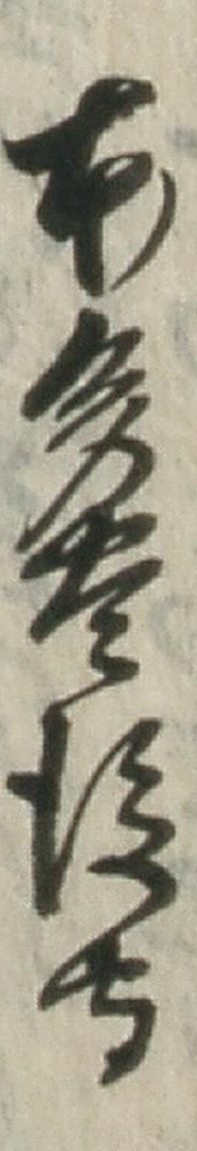本多豊後守
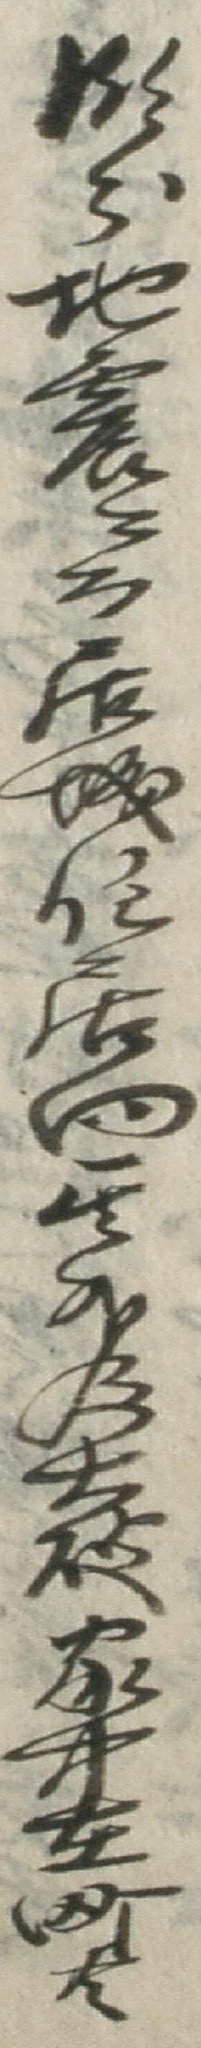領分地震二而居城住居向其外及大破家中在町共
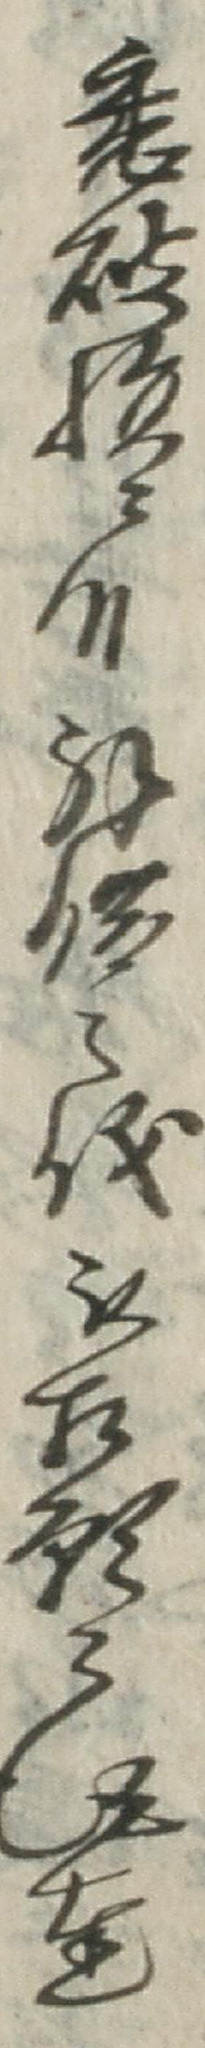悉破損二付拝借之儀被相願候趣達
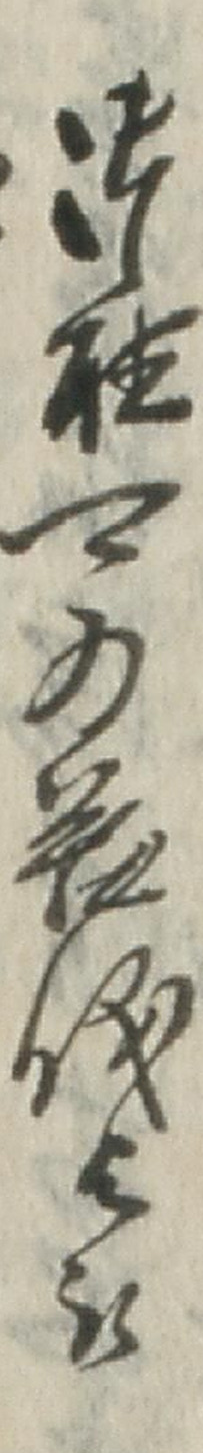御聴可為難儀と被
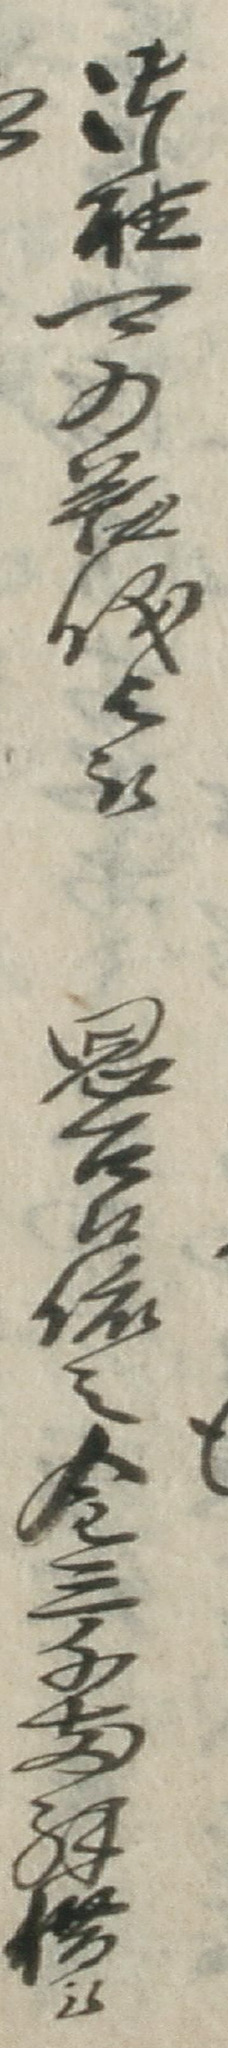御聴可為難儀と被思召候依之金三千両拝借被
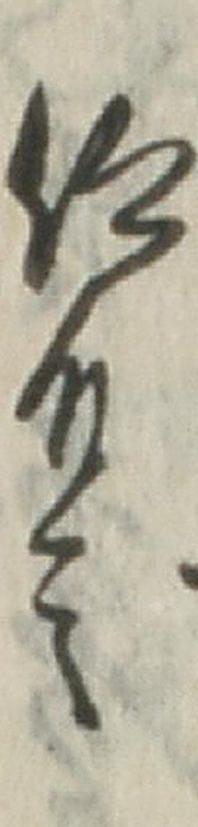仰付之
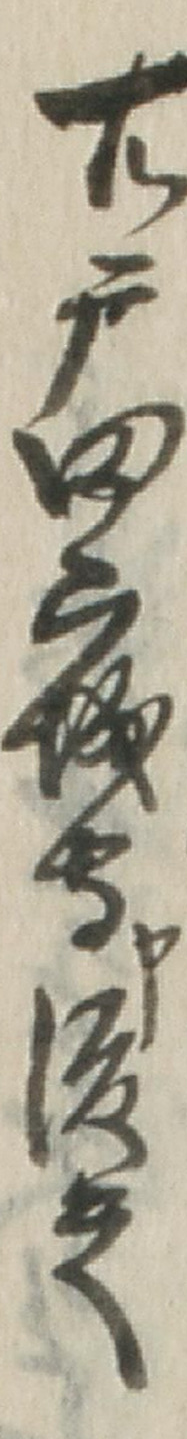右戸田山城守申渡之
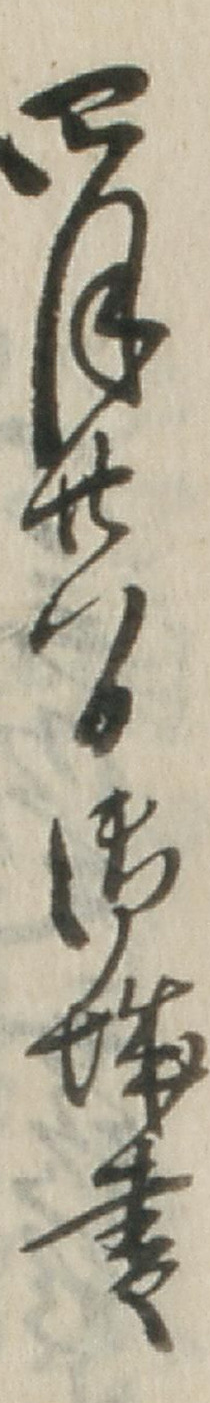四月廿八日御城書
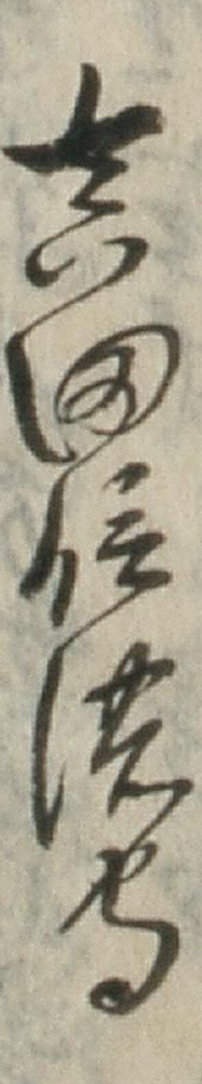真田信濃守
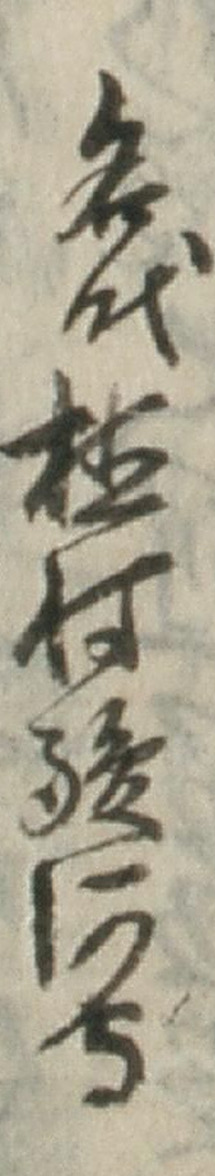名代植村駿河守
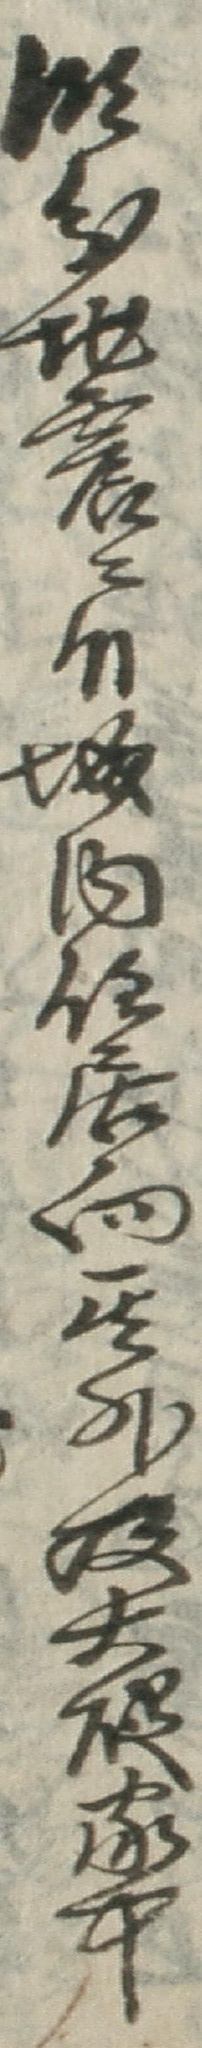領分地震二付城内住居向其外及大破家中
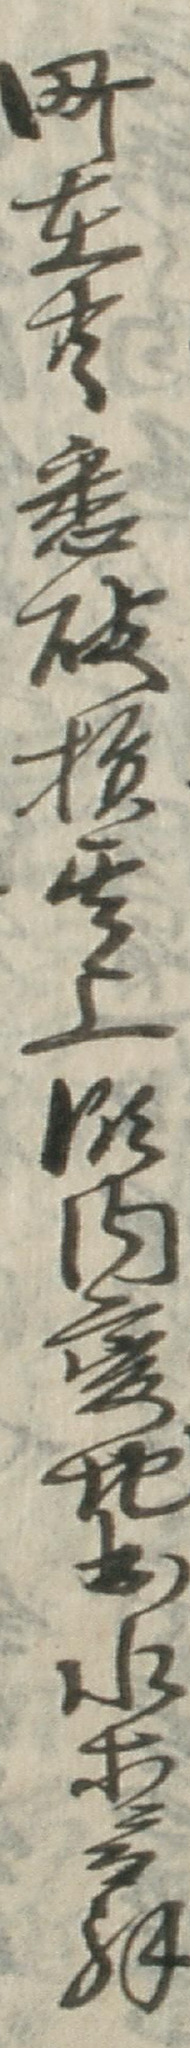町在共悉破損其上領内変地出水等二而拝
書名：信濃國地震實録記
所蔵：東京大学地震研究所図書室 Earthquake Research Institute Library, The University of Tokyo, JAPAN
